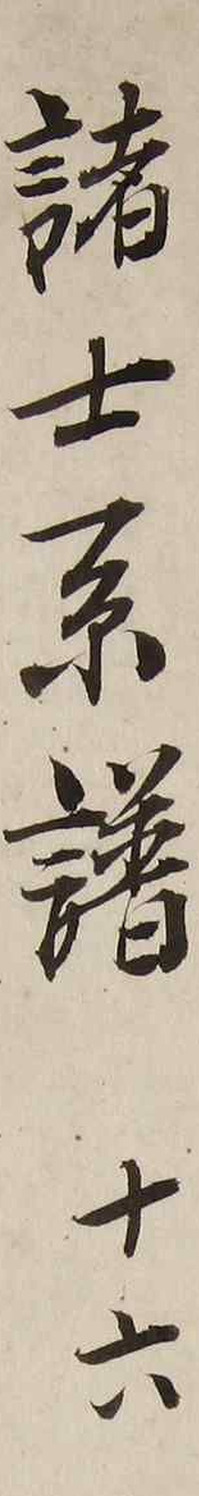諸士系譜十六

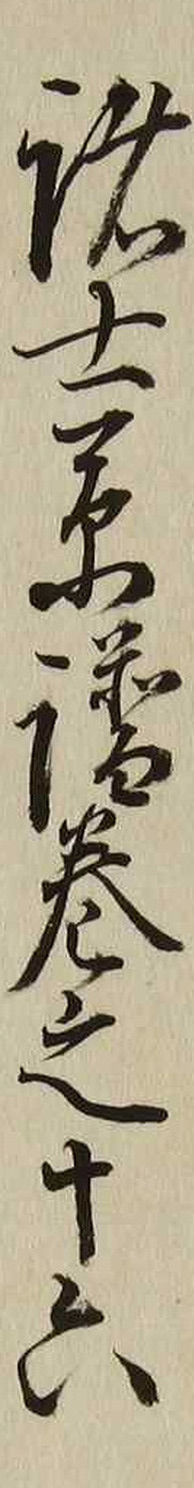諸士系譜巻之十六
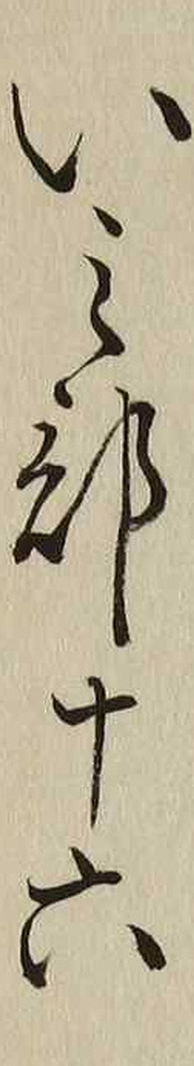い之部十六
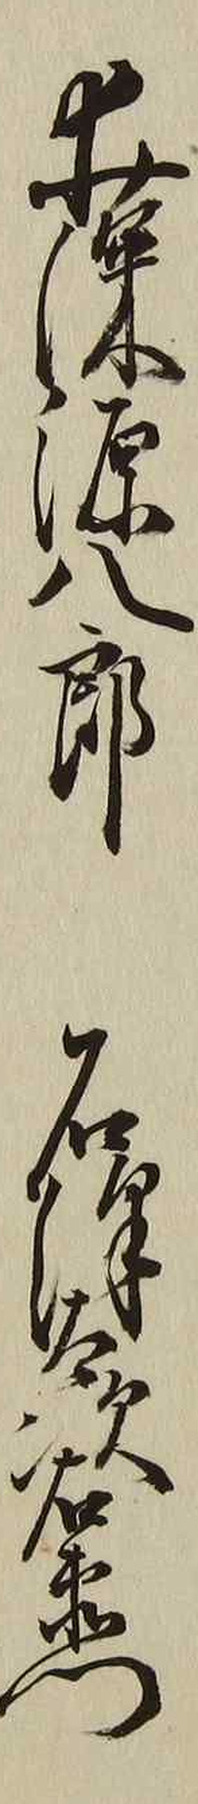井深源八郎石津太次右衛門

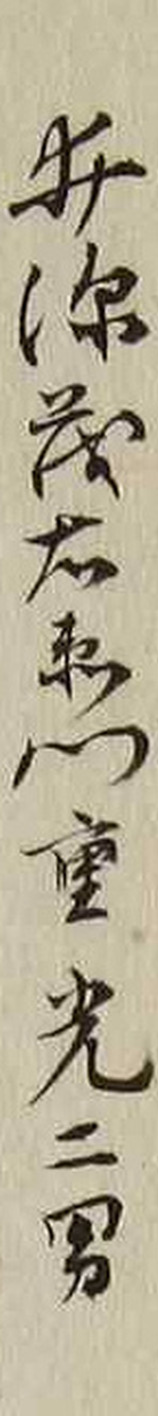井深茂右衛門重光二男
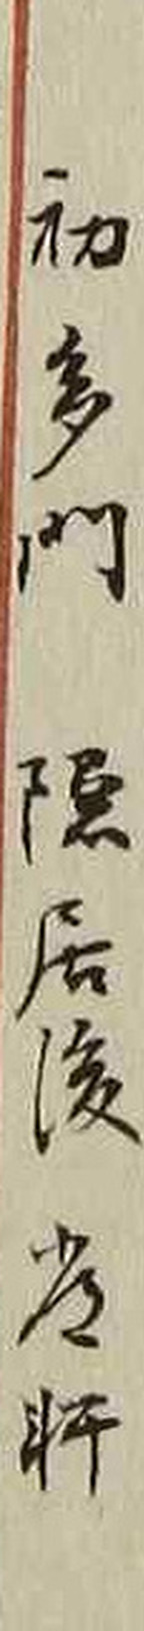初多門隠居後常肝
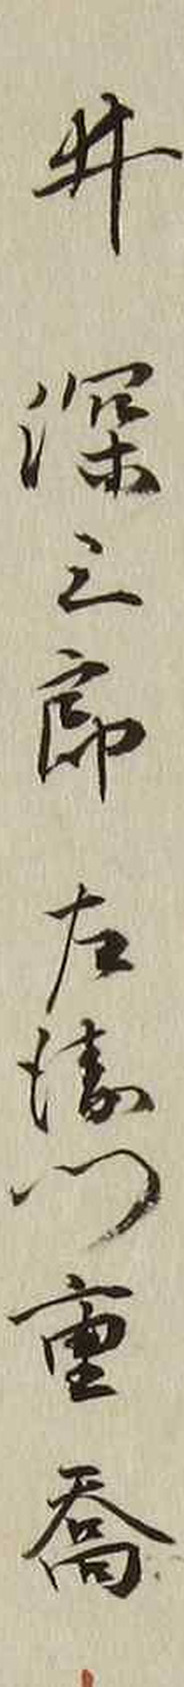井深三郎左衛門重喬
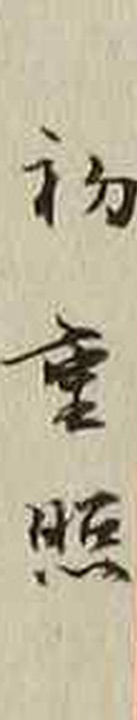初重照
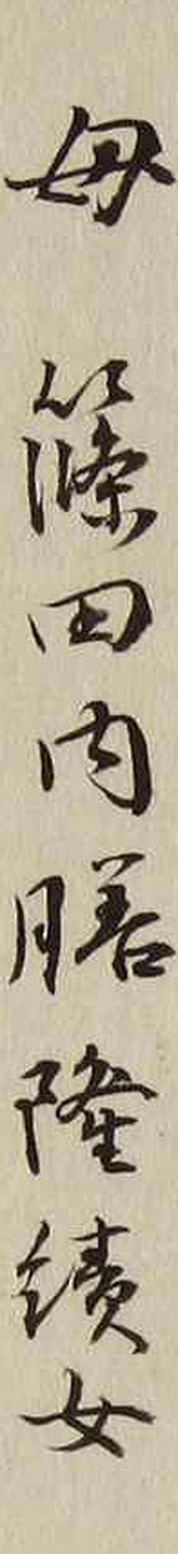母篠田内膳た隆続女
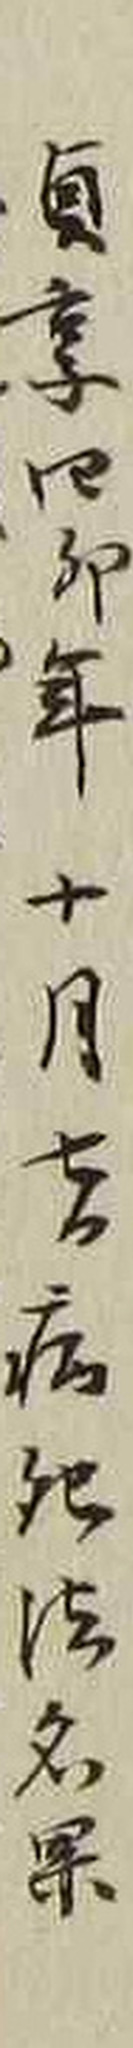貞享四卯年十月七日病死法名果
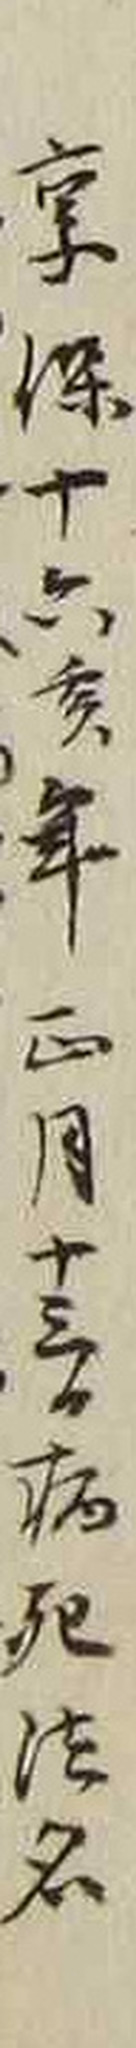享保十六亥年正月十三日病死法

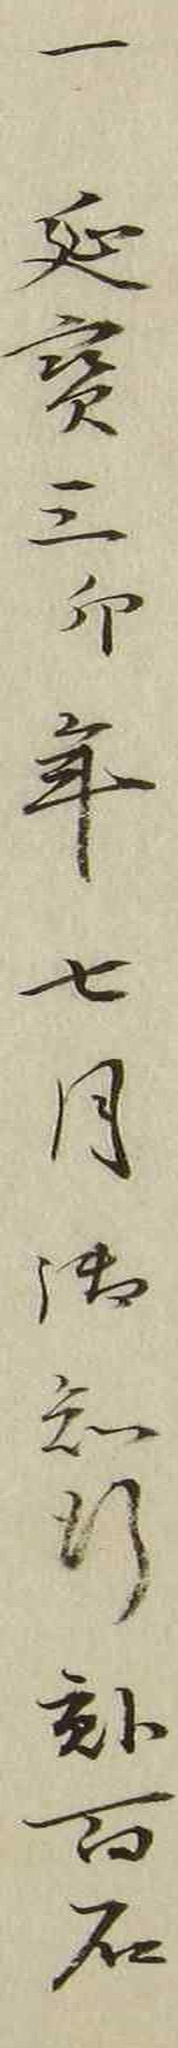一延宝三卯年七月御知行弐百石
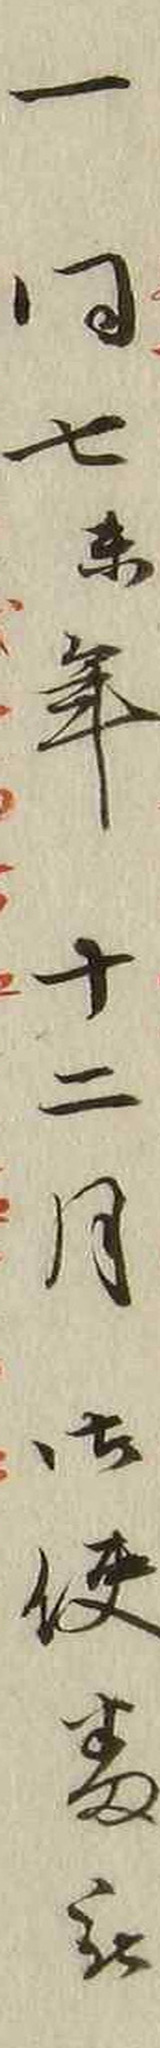一同七未年十二月御使番
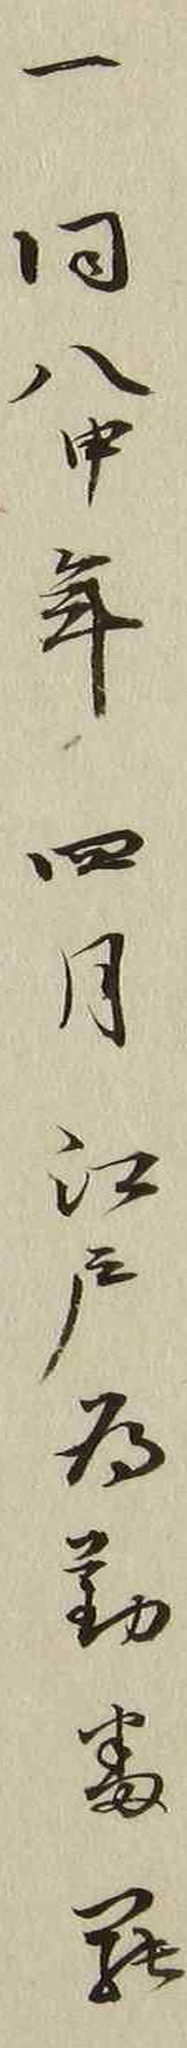一同八申年四月江戸勤番之為罷り
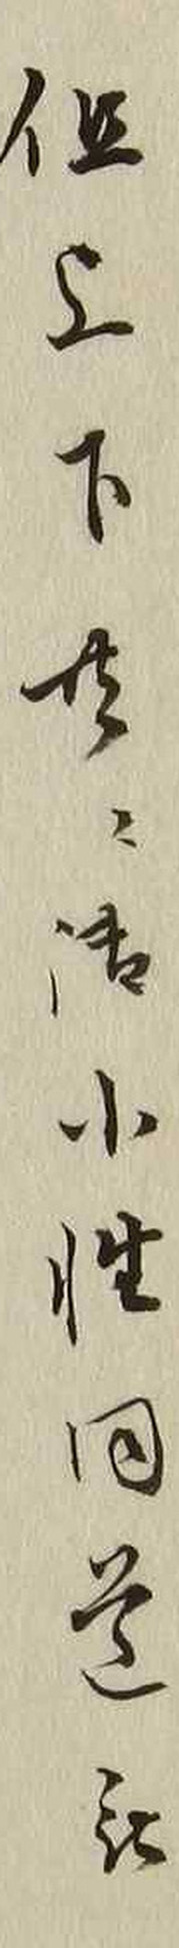但し上下共ニ御小姓同道
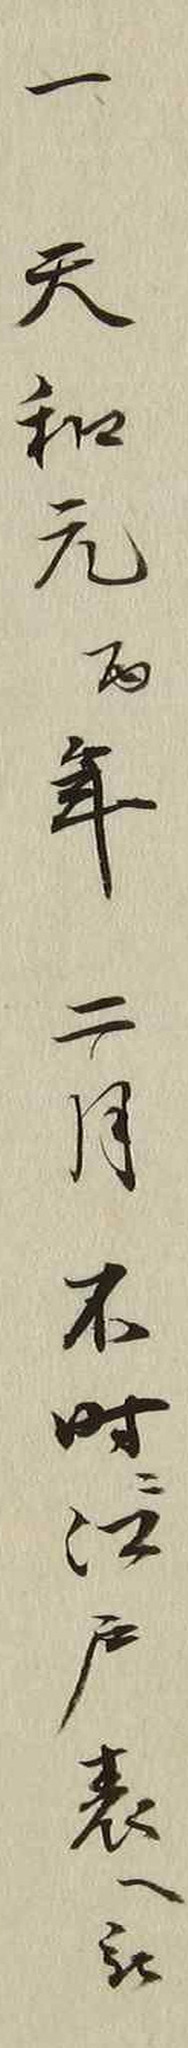一天和元酉年二月不時ニ江戸表へ
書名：諸士系譜　巻之16　い之部16
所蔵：会津若松市立会津図書館
